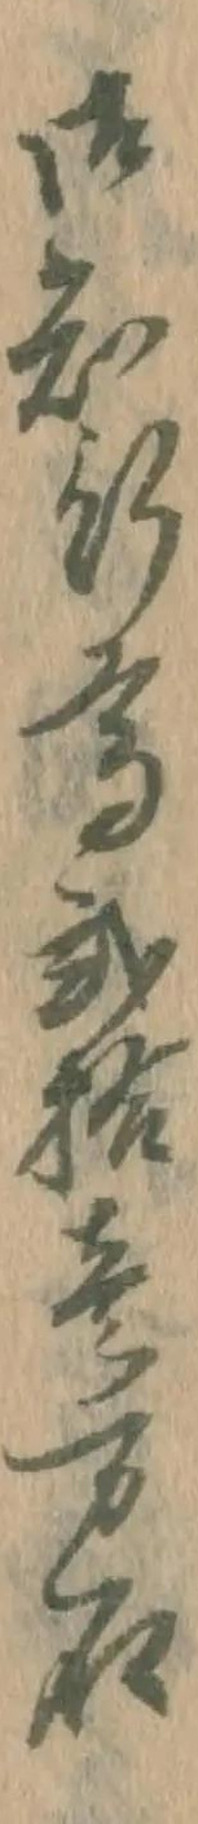御知行高弐拾壱万石
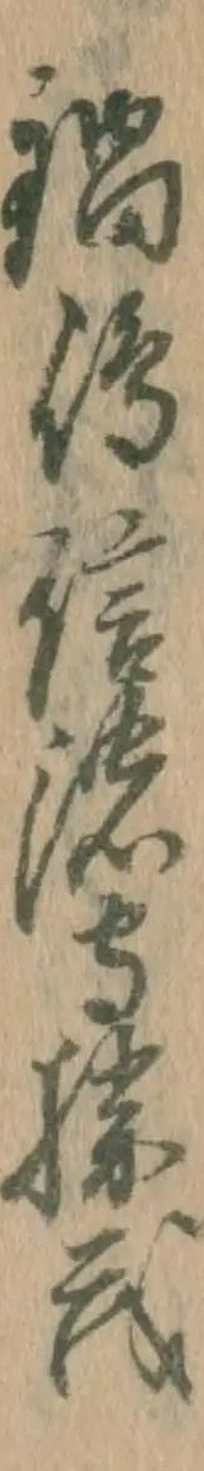鍋島信濃守勝茂
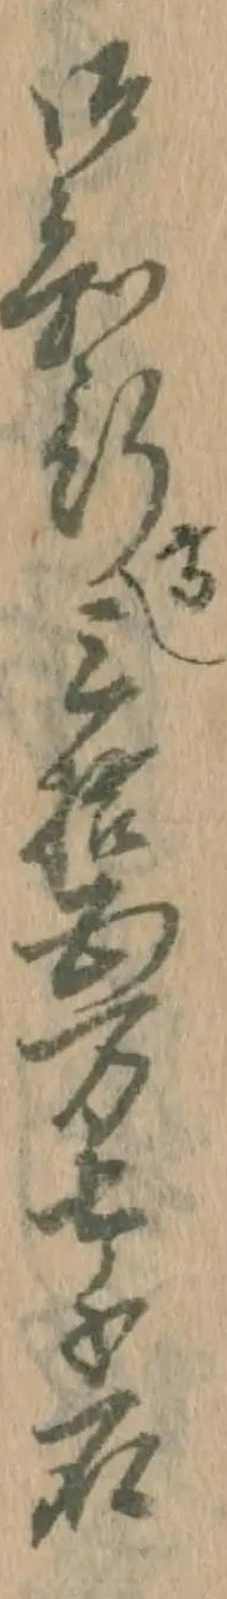御知行高三拾五万七千石
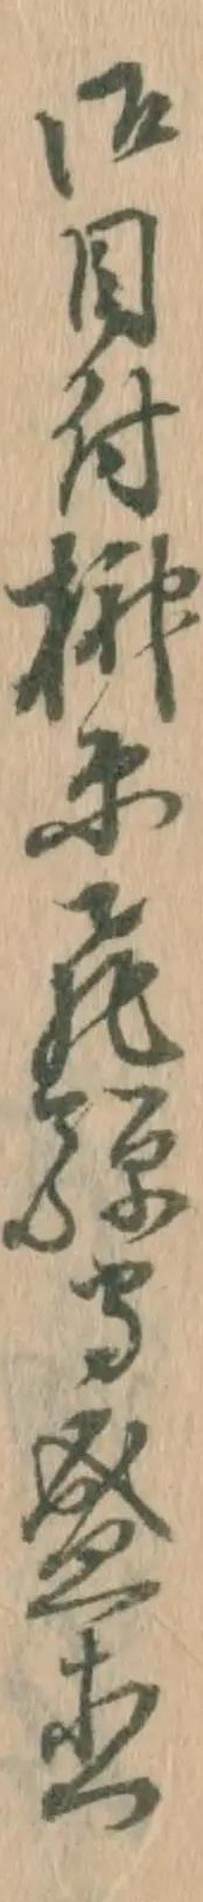御目付榊原飛騨守盛直
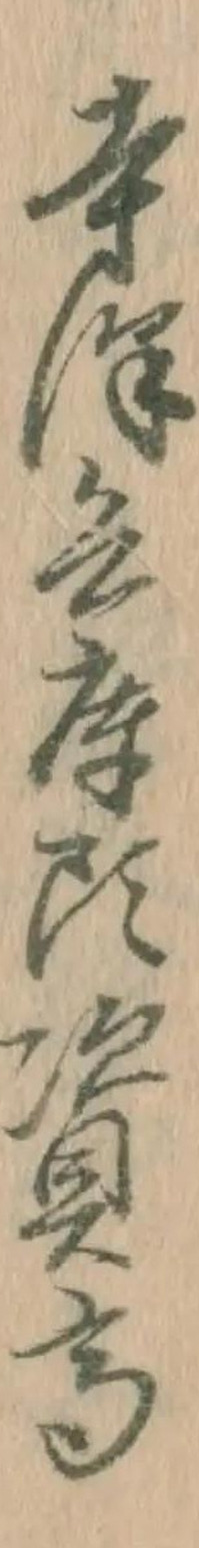寺沢兵庫頭資高
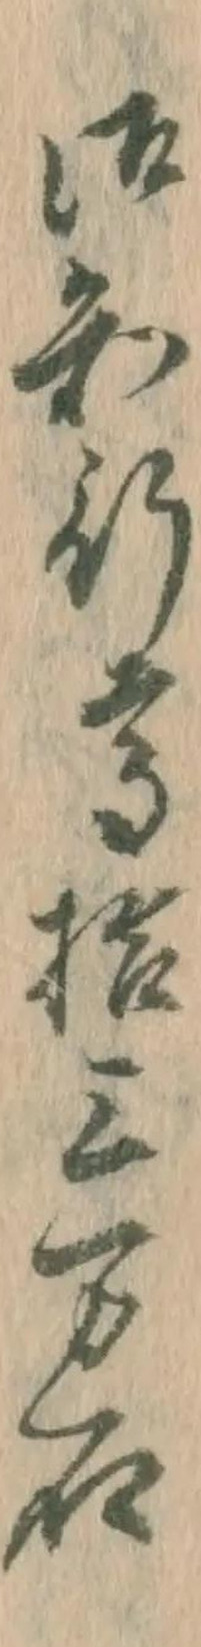御知行高拾三万石
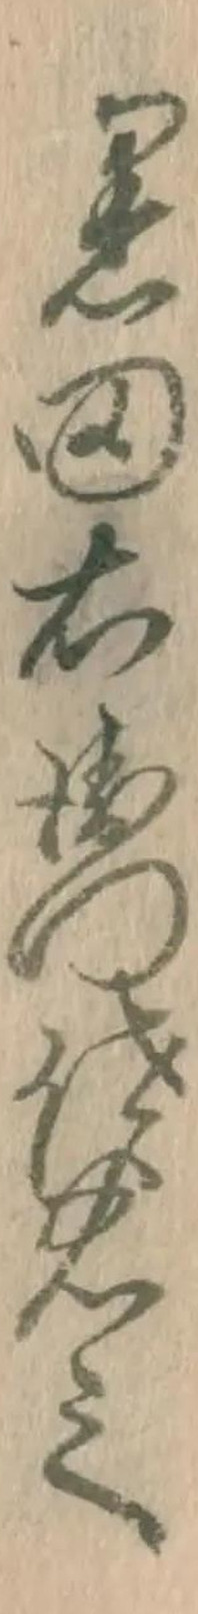黒田右衛門佐忠之
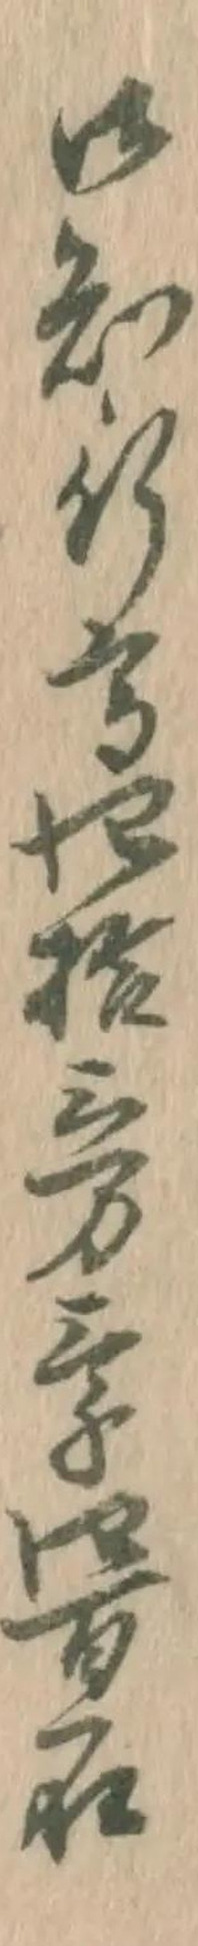御知行高四拾三万三千四百石
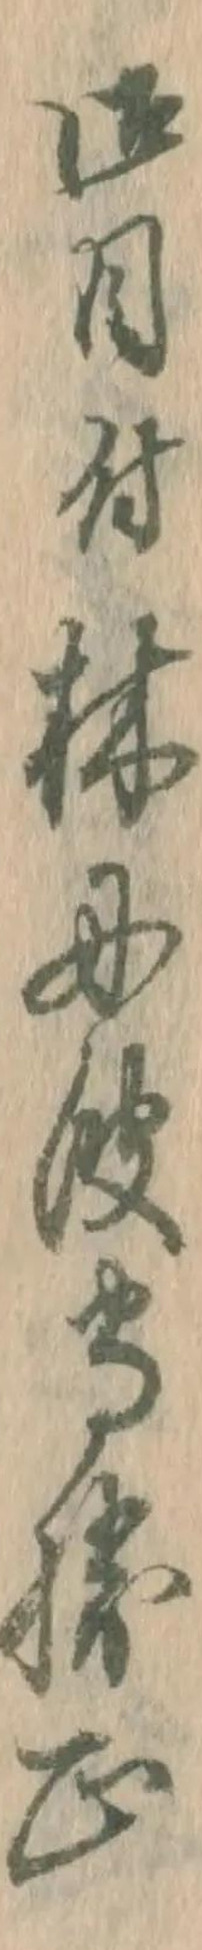御目付林丹波守勝正
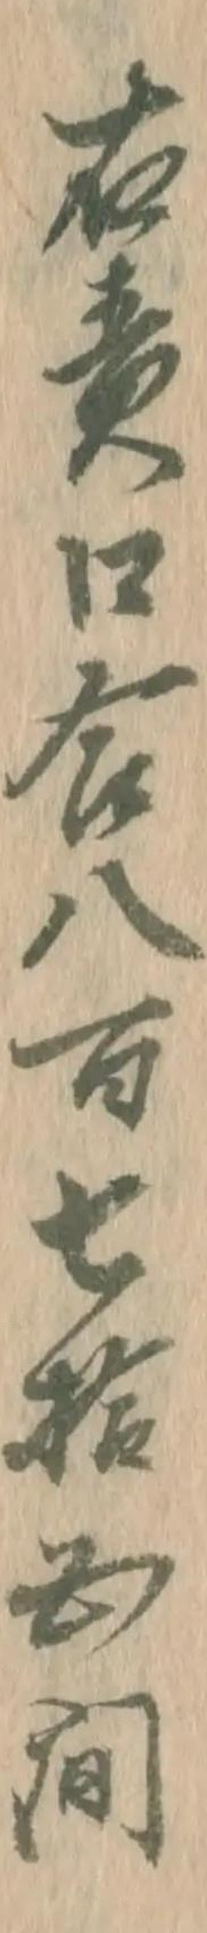右責口合八百七拾五間
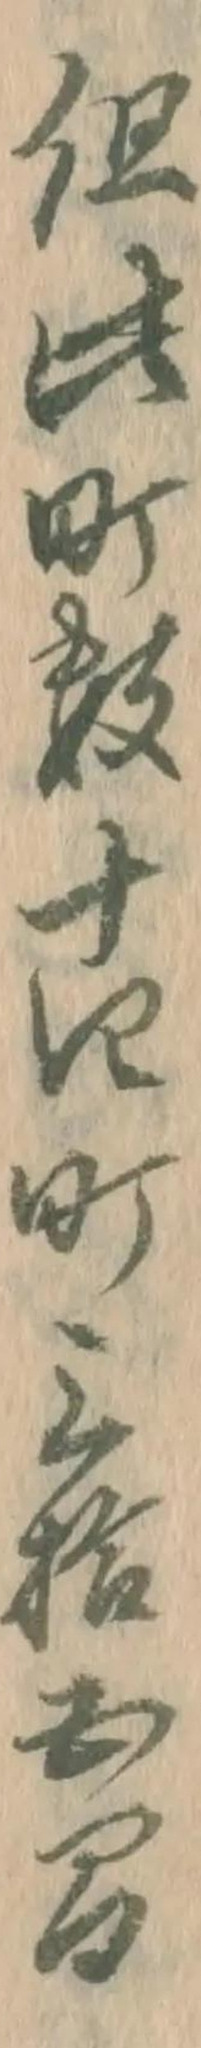但此町数十四町三拾五間

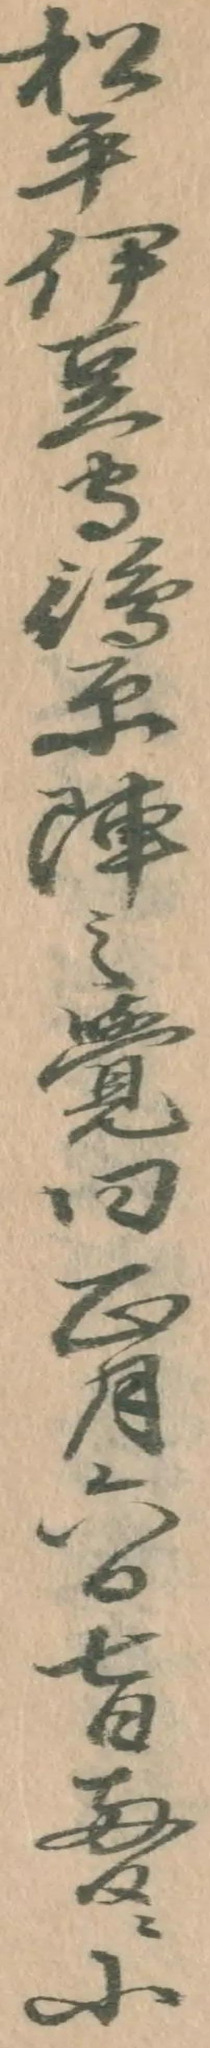松平伊豆守島原陣之覚曰正月六日七日両日に小
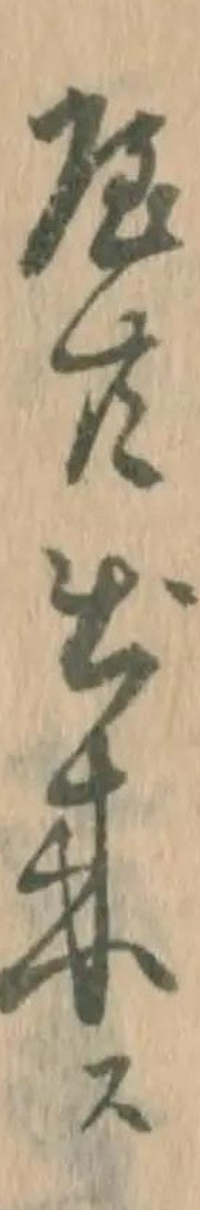屋共出来す
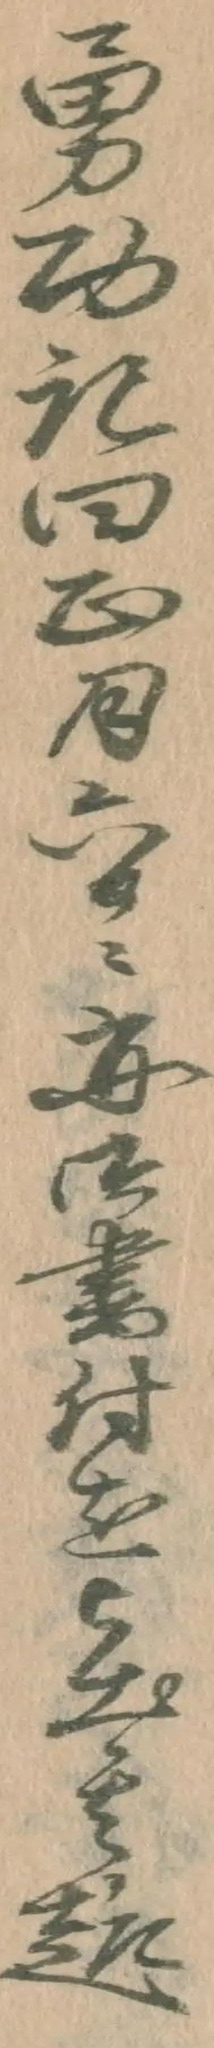勇功記曰正月六日に亦御書付を被出其趣
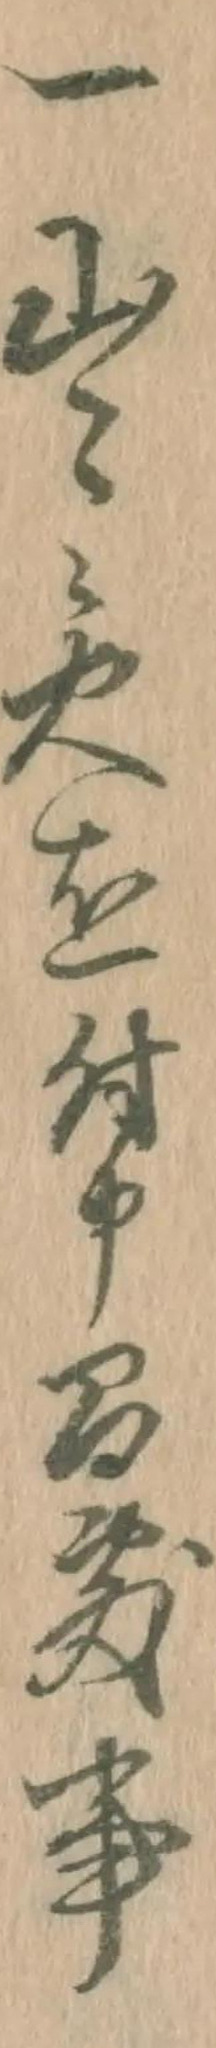一山々に火を付申間敷事
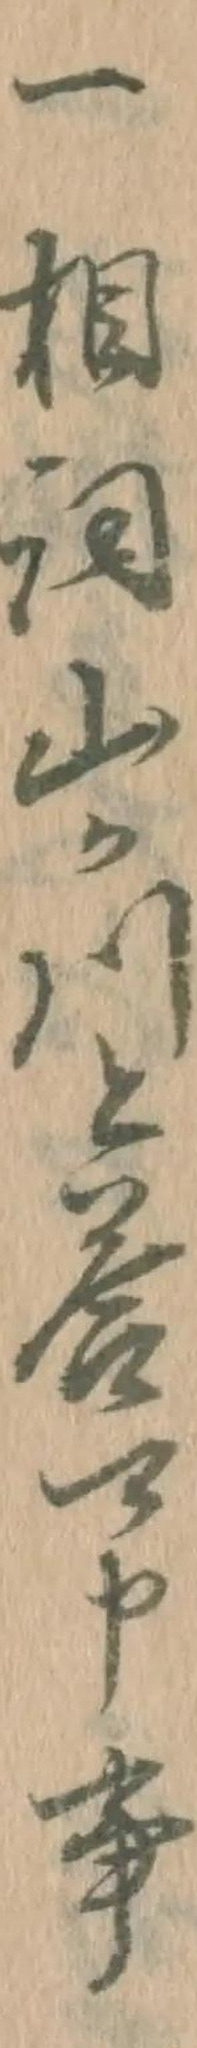一相詞山か川と答可申事
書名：切支丹御退治記 49巻. [5]
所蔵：国立国会図書館 National Diet Library, JAPAN
